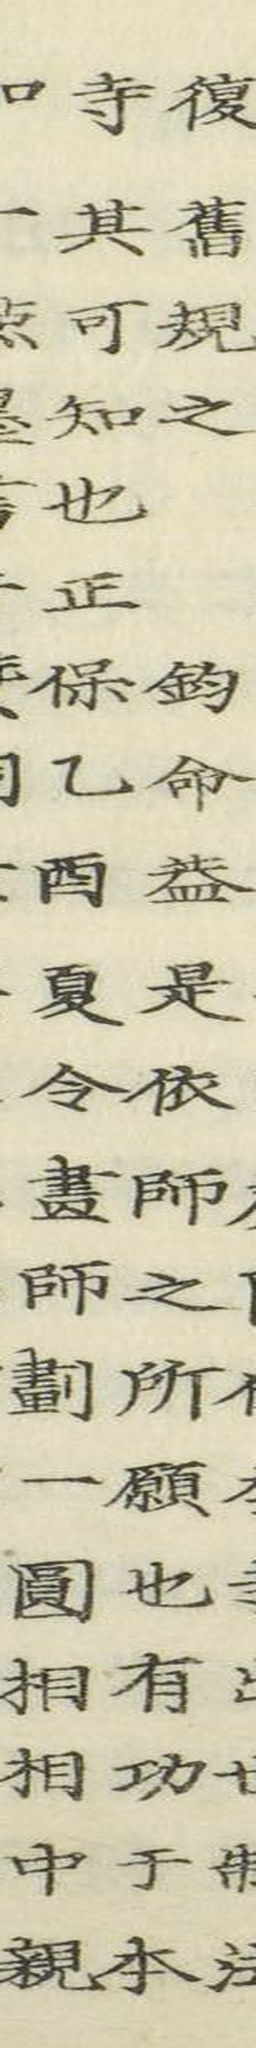寺其可知也正保乙酉夏令𦘕師劃一圓相相中親
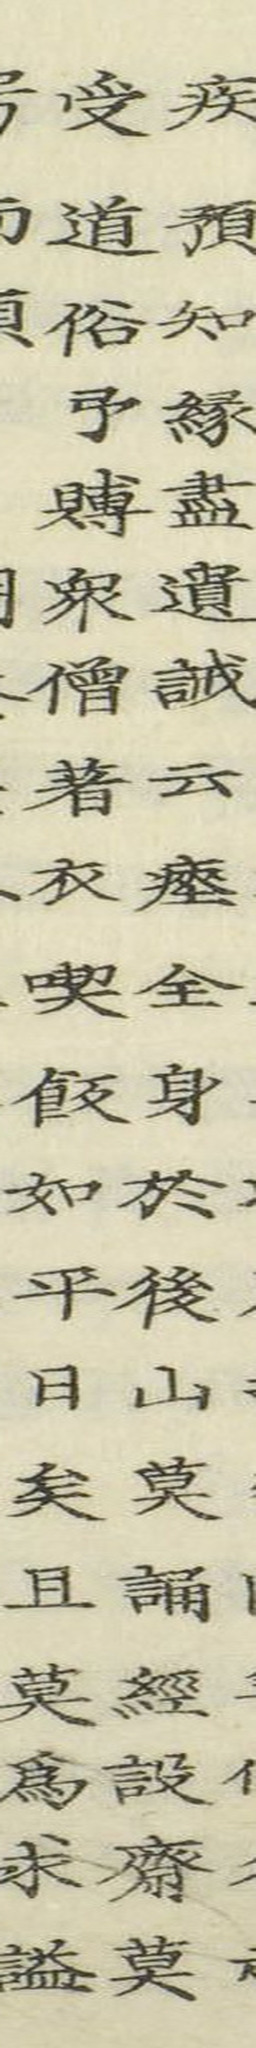受道俗弔賻衆僧著衣喫飯如平日矣且莫爲求謚
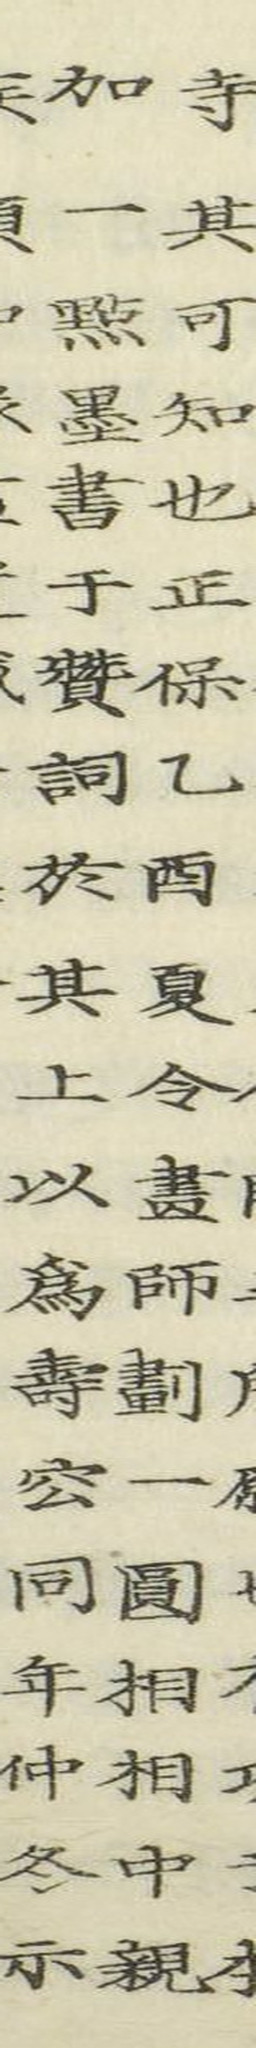加一點墨書于贊詞於其上以爲壽㝐同年仲冬示
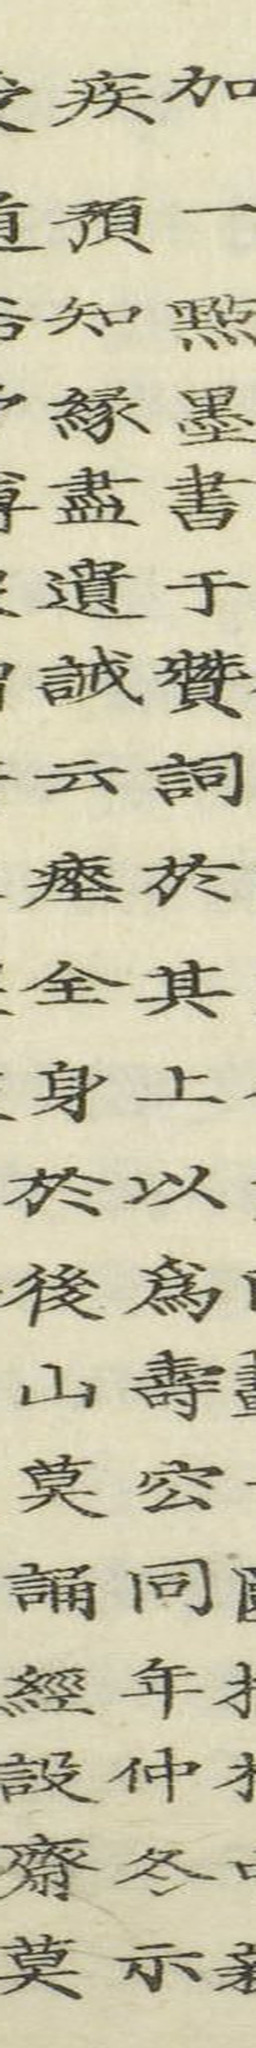疾預知縁盡遺誡云瘞全身於後山莫誦經設齋莫
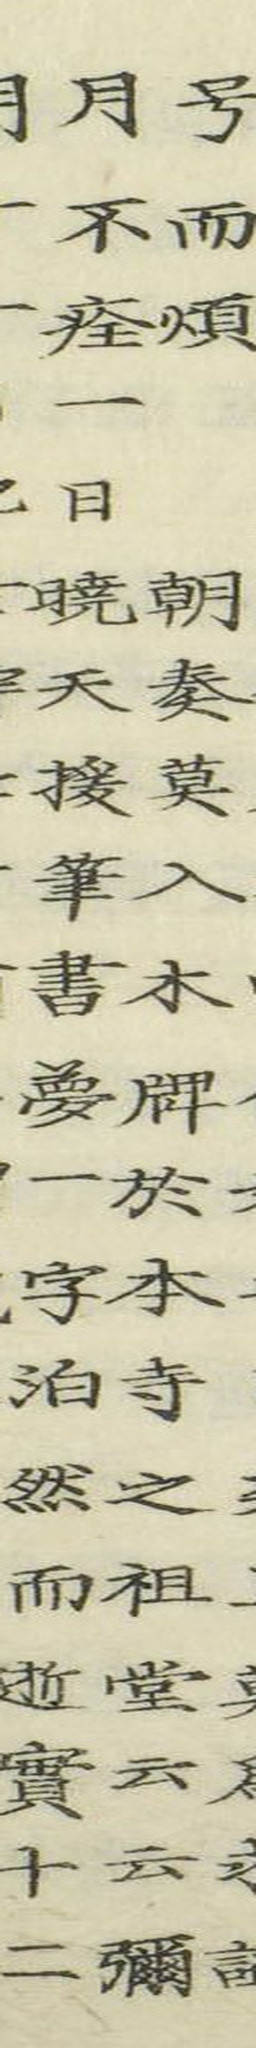月不痊一日暁天授筆書夢一字泊然而逝實十二
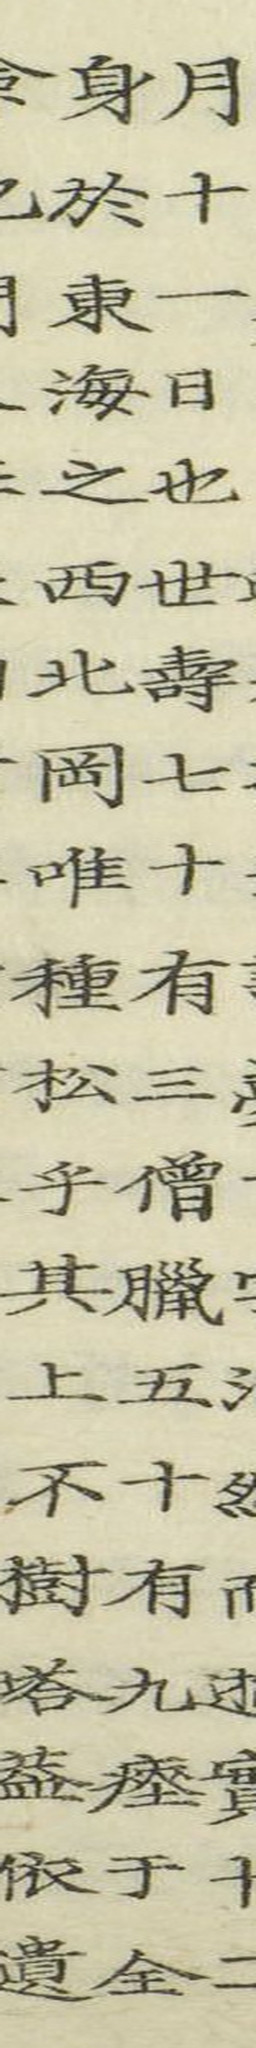身於東海之西北岡唯種松乎其上不樹塔葢依遺
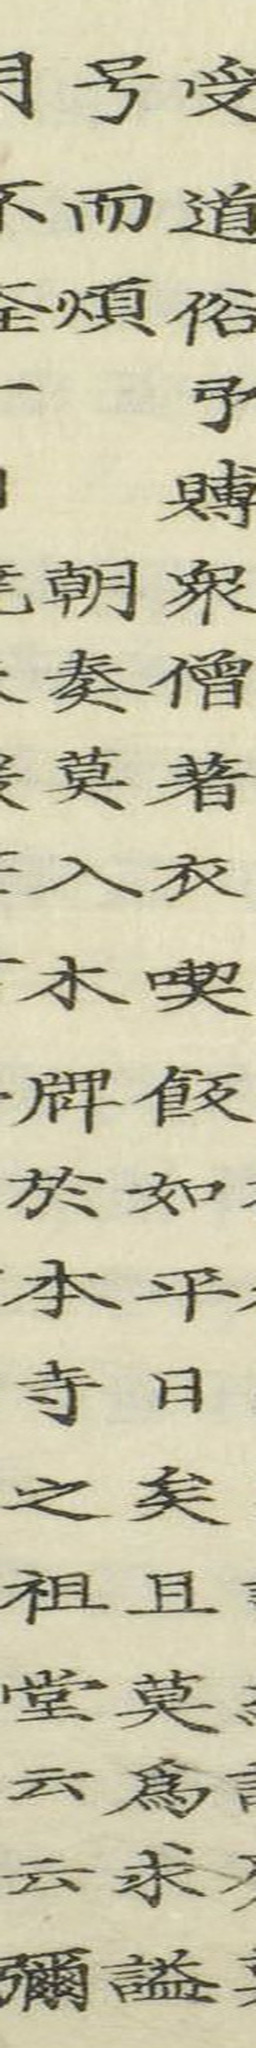号而煩朝奏莫入木牌於本寺之祖堂云云彌
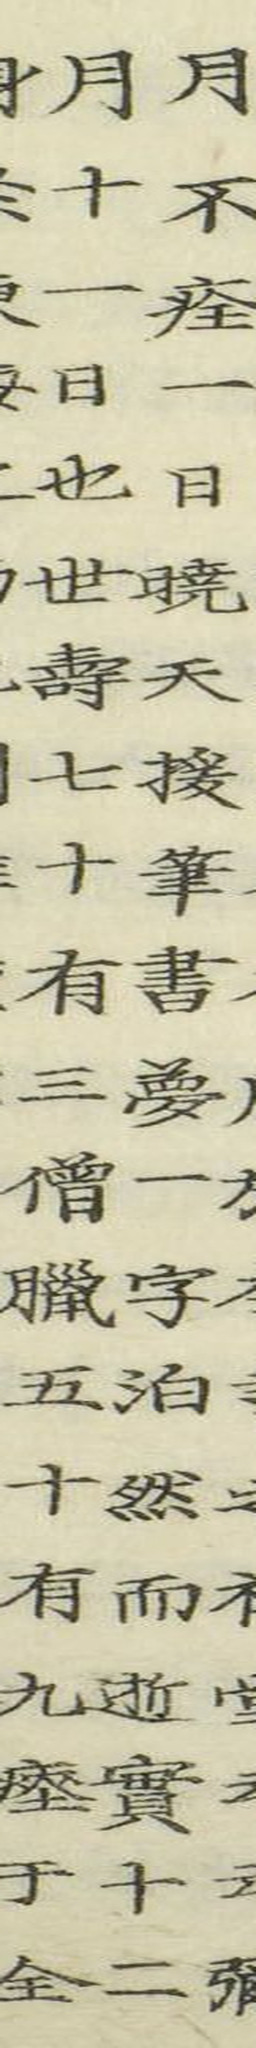月十一日也世壽七十有三僧臘五十有九瘞于全
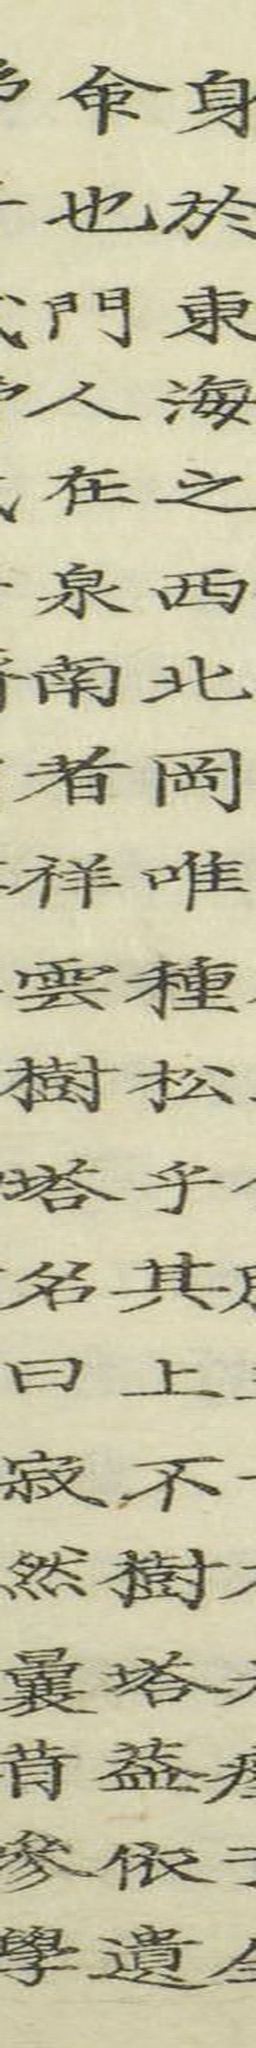𫝇也門人在泉南者祥雲樹塔名曰寂然曩昔參學
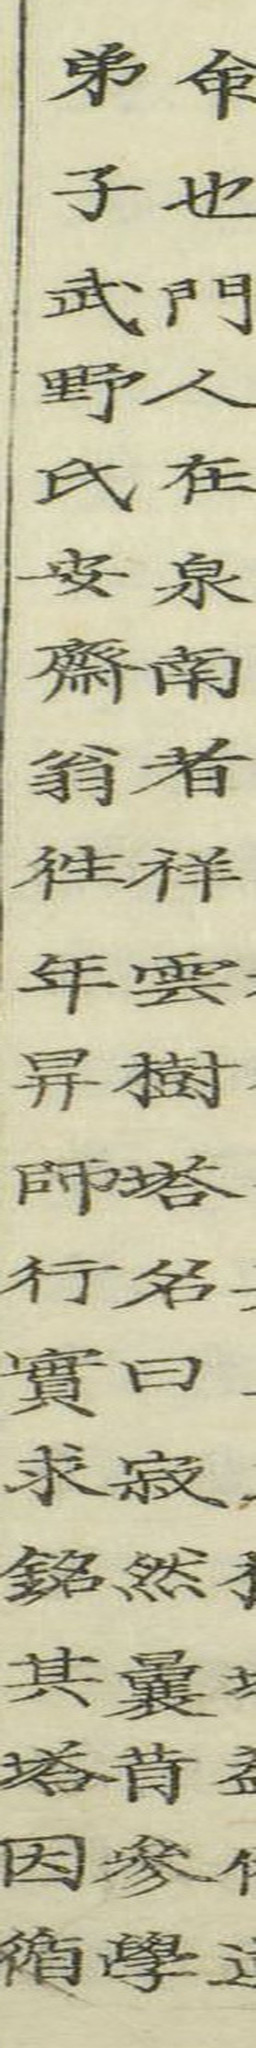弟子武野氏安齋翁往年昇師行實求銘其塔因循

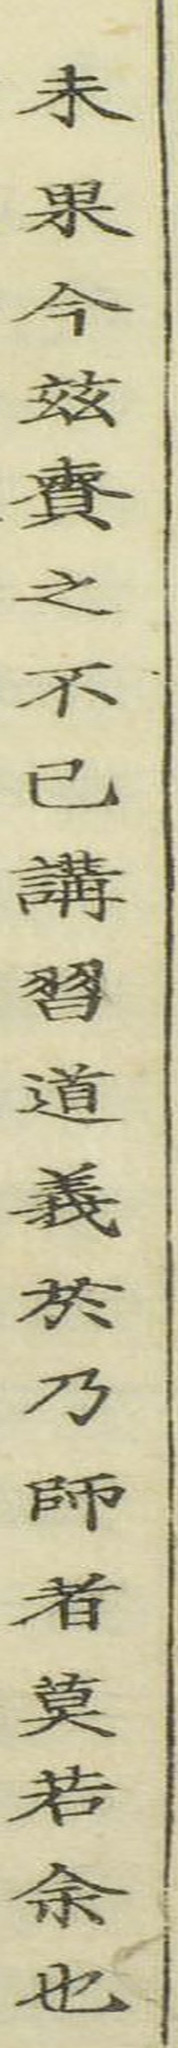未果今玆𧷏之不已講習道義於乃師者莫若余也
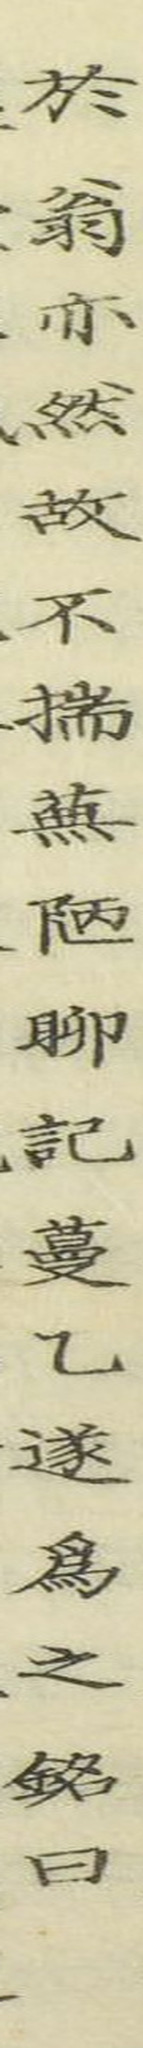於翁亦然故不揣蕪陋聊記蔓乙遂爲之銘曰
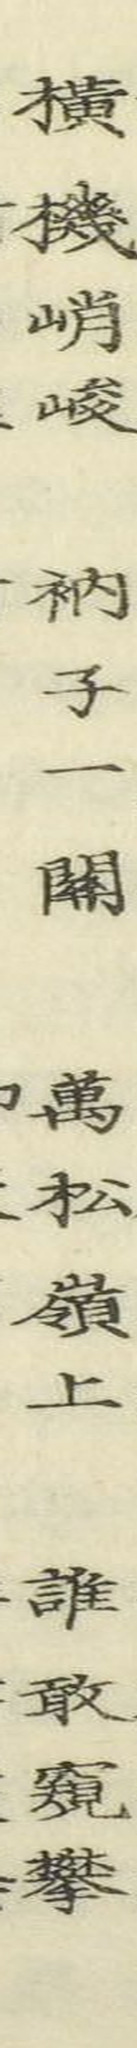横機峭峻衲子一關萬松嶺上誰敢窺攀
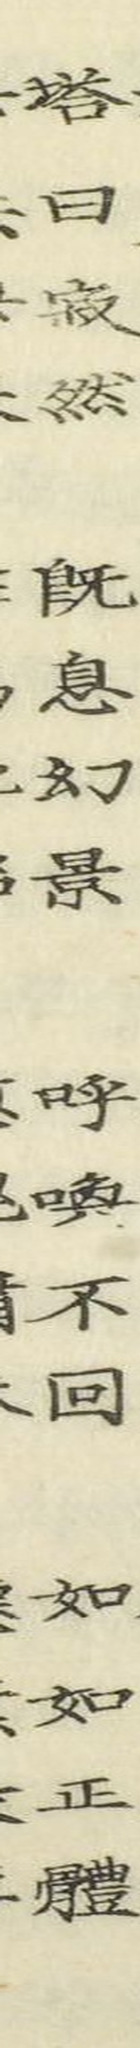塔曰寂然既息幻景呼喚不回如如正體
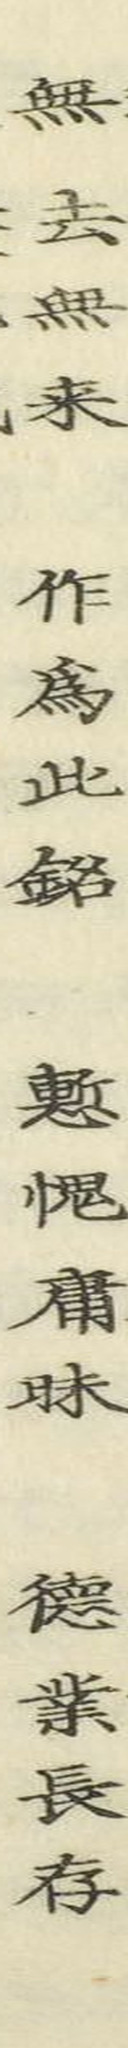無去無来作爲此銘慙愧庸昧德業長存
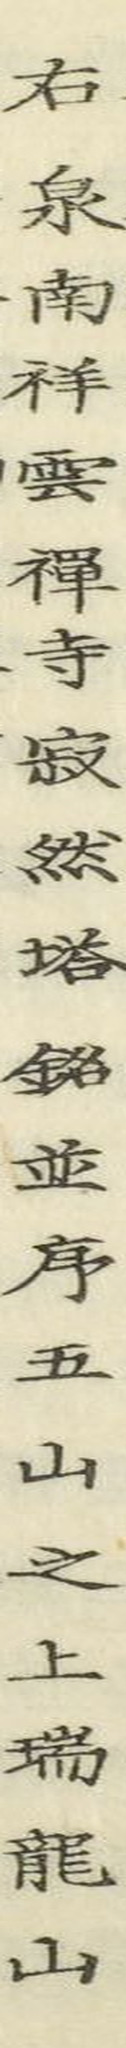右泉南祥雲禪寺寂然塔銘並序五山之上瑞龍山
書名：江戸名所図会 20巻 巻之4
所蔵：東京学芸大学教育コンテンツアーカイブ
